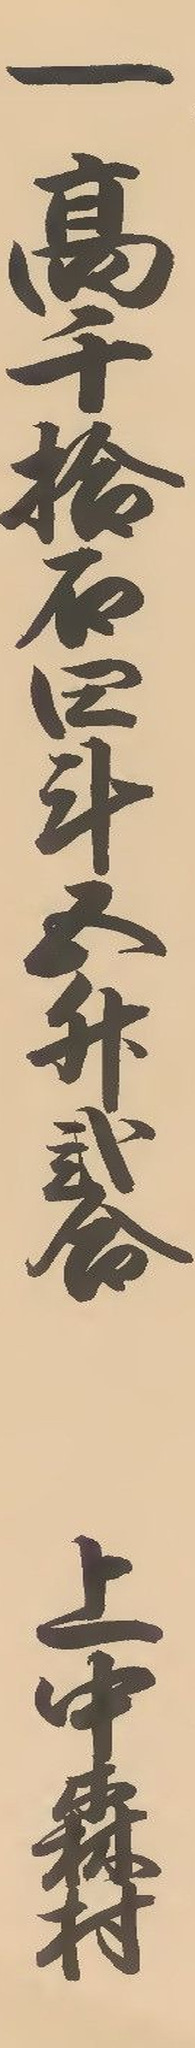一髙千拾石四斗五升弐合上中森村
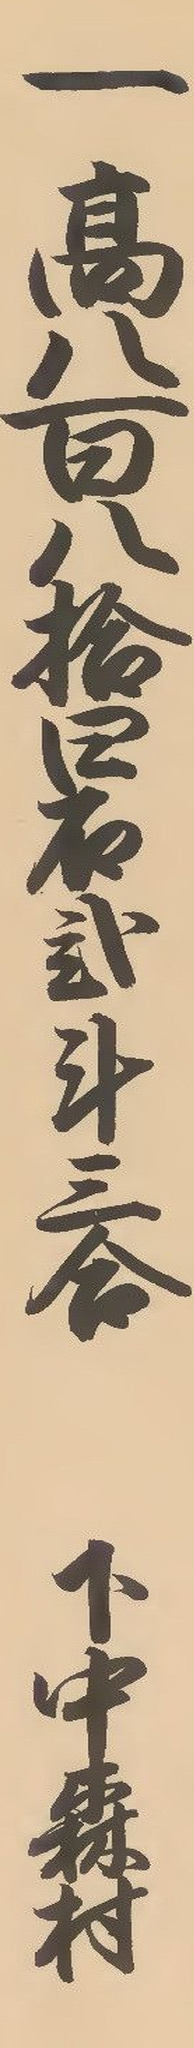一髙八百八拾四石弐斗三合下中森村

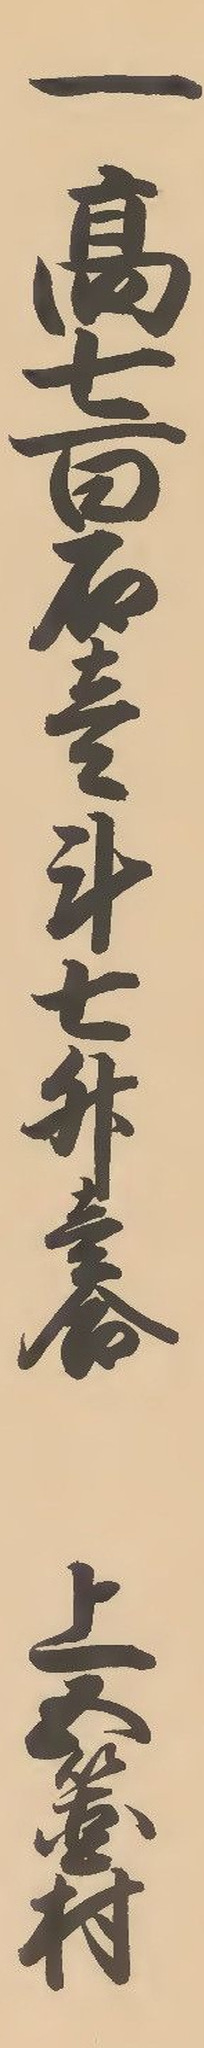一髙七百石壱斗七升壱合上五箇村
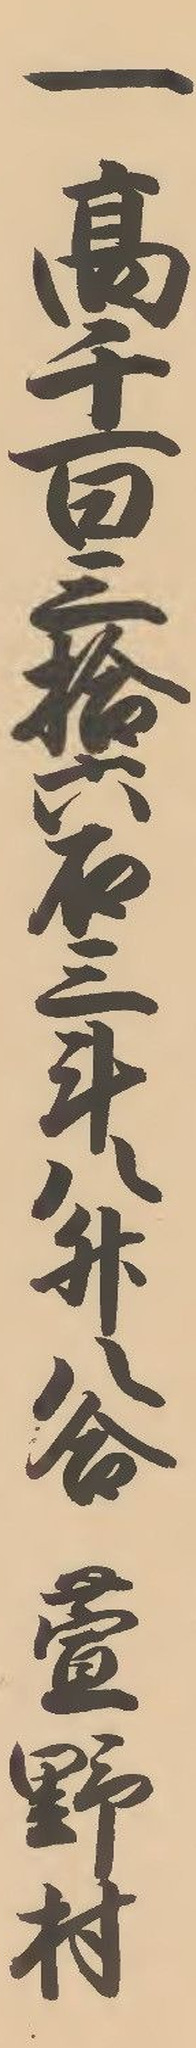一髙千百三拾六石三斗八升八合萱野村
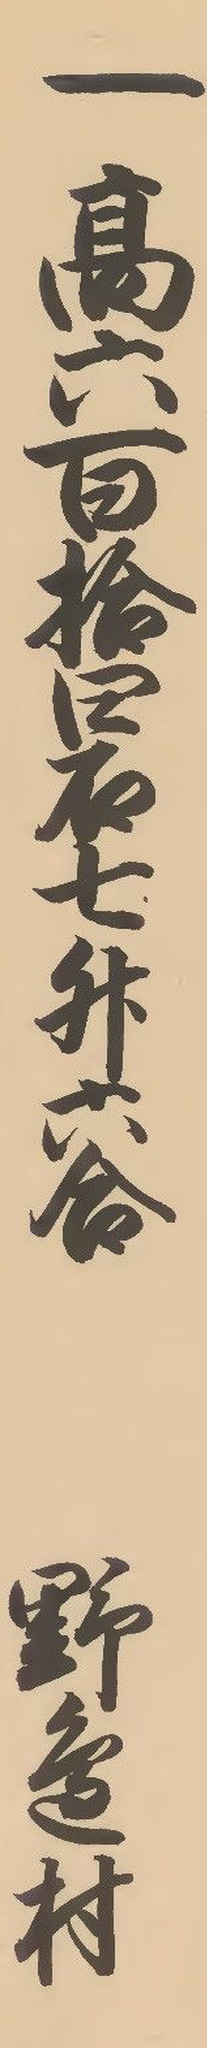一髙六百拾四石七斗六合野辺村
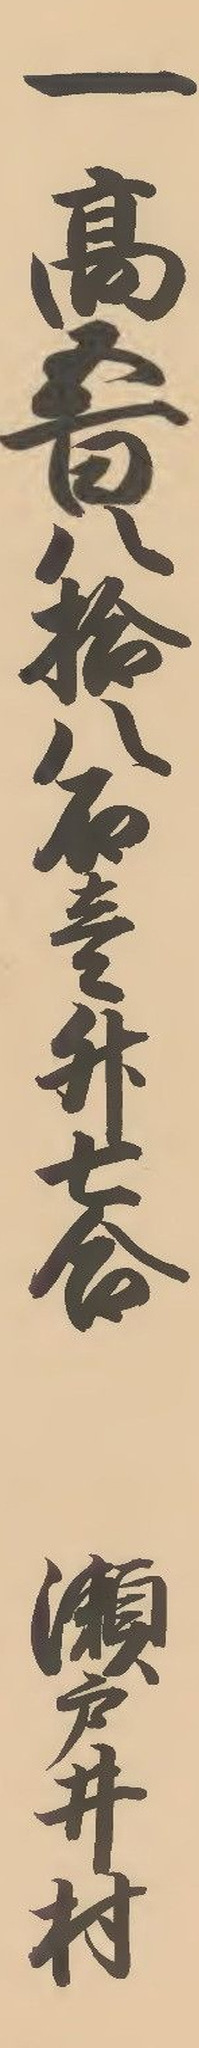一髙五百八拾八石壱升七合瀬戸井村
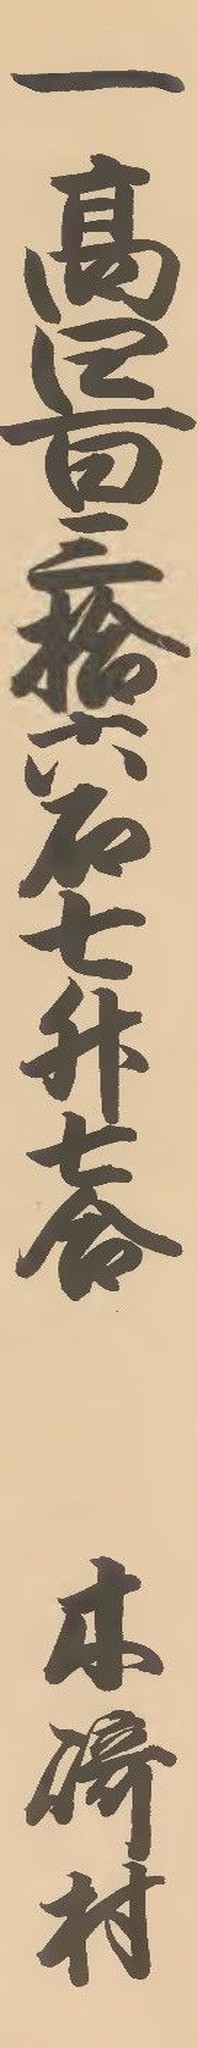一髙四百三拾六石七升七合木崎村
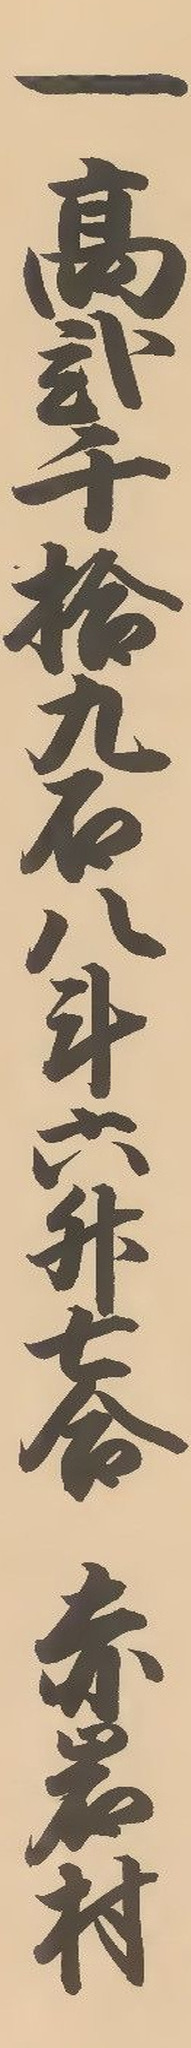一髙弐千拾九石八斗六升七合赤岩村
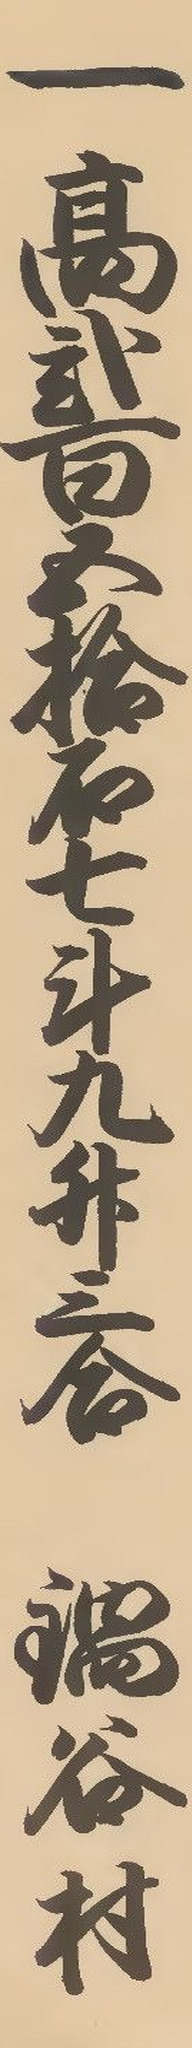一髙弐百五拾石七斗九升三合鍋谷村
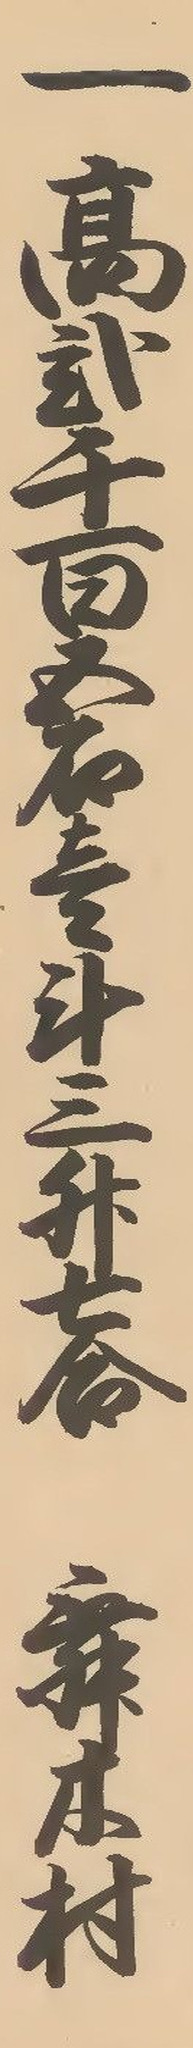一髙弐千百五石壱斗三升七合舞木村

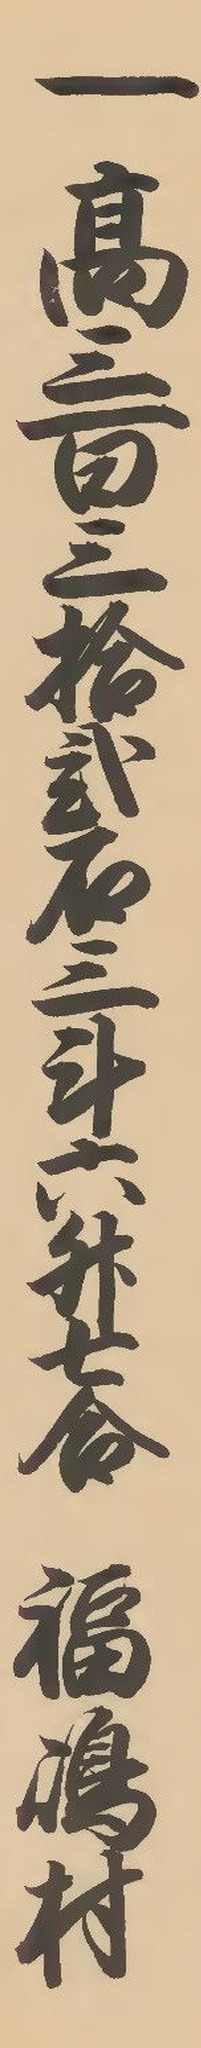一髙三百三拾弐石三斗六升七合福嶋村
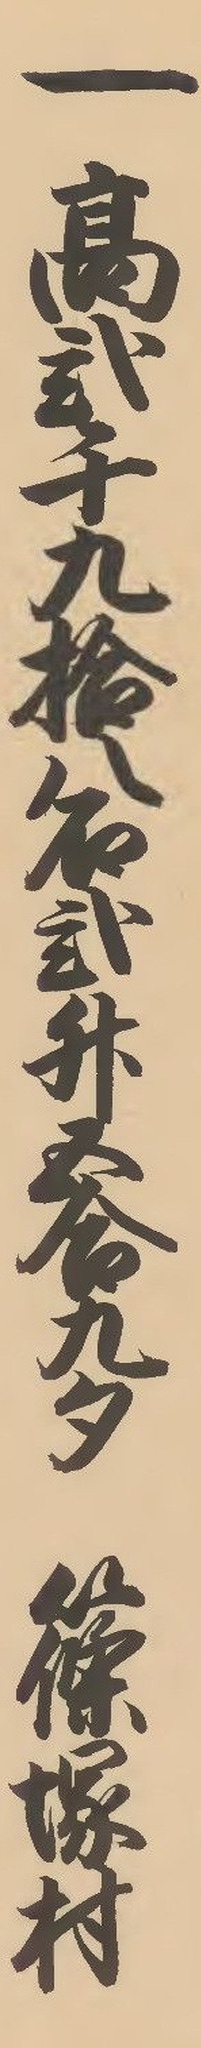一髙弐千九拾八石弐升五合九夕篠塚村
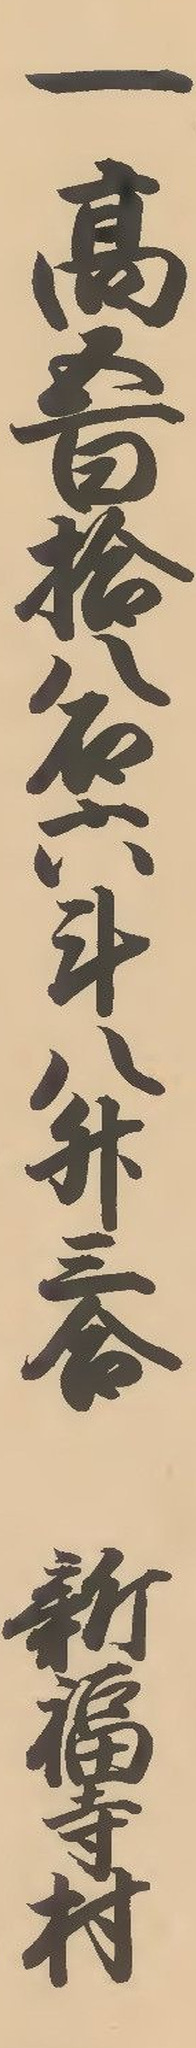一髙五百拾八石六斗八升三合新福寺村
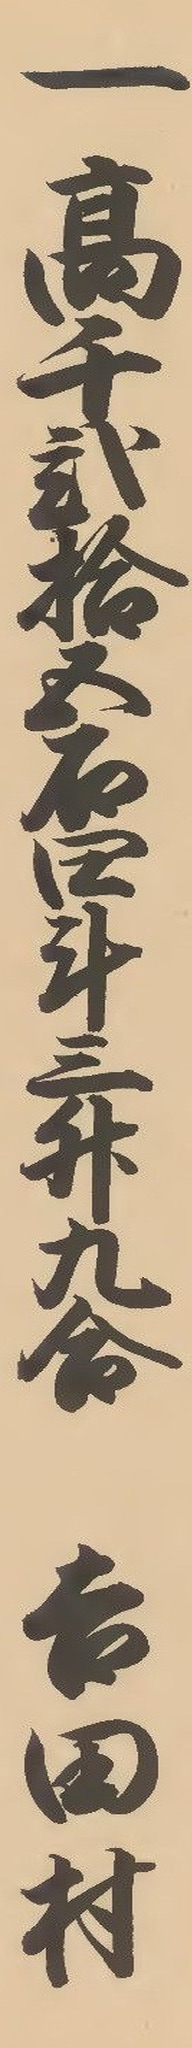一髙千弐拾五石四斗三升九合吉田村
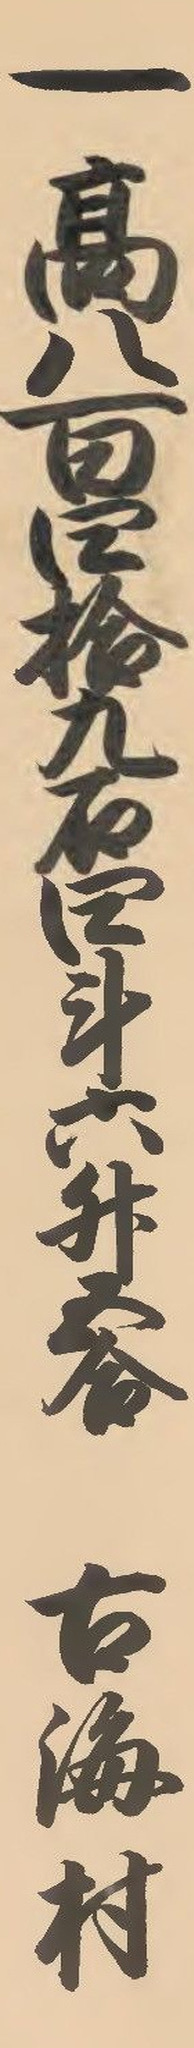一髙八百四拾九石四斗六升五合古海村
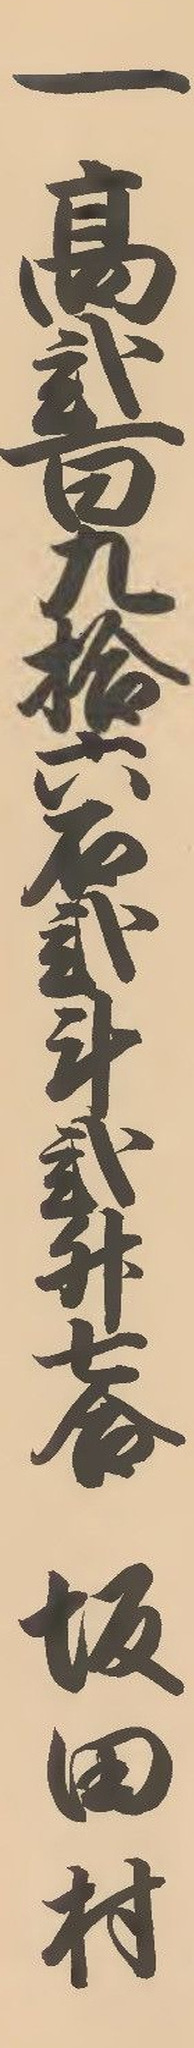一髙弐百九拾六石弐斗弐升七合坂田村
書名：上野国郷帳
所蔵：国立公文書館 National Archives of Japan
